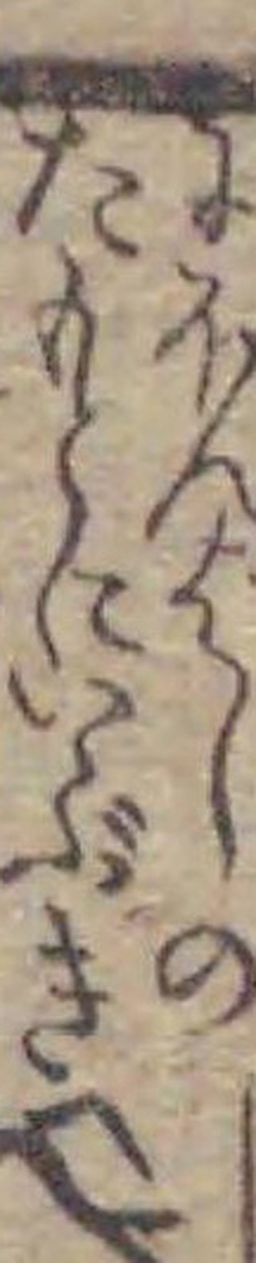たもとにいぶき
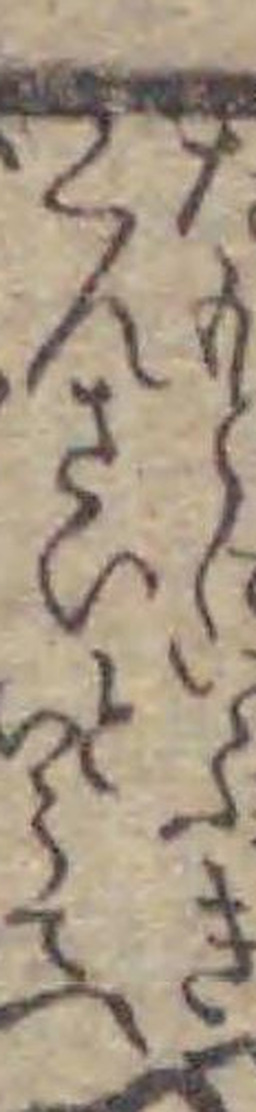くんさいというて
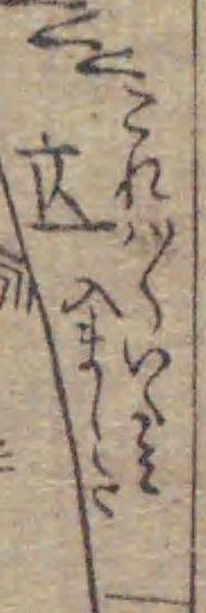これは〳〵いたみ
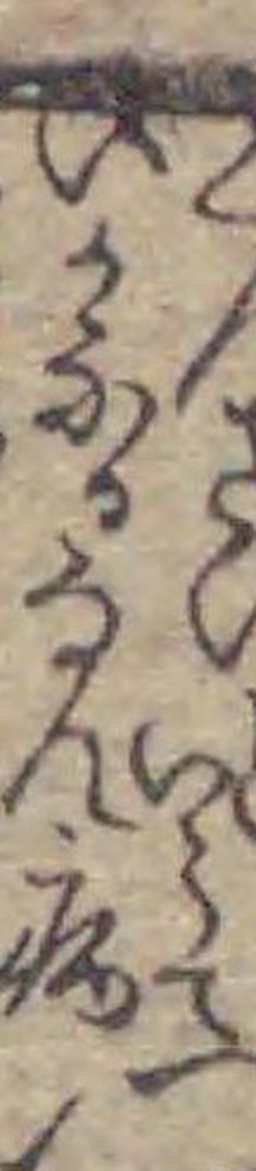いかなるなん病
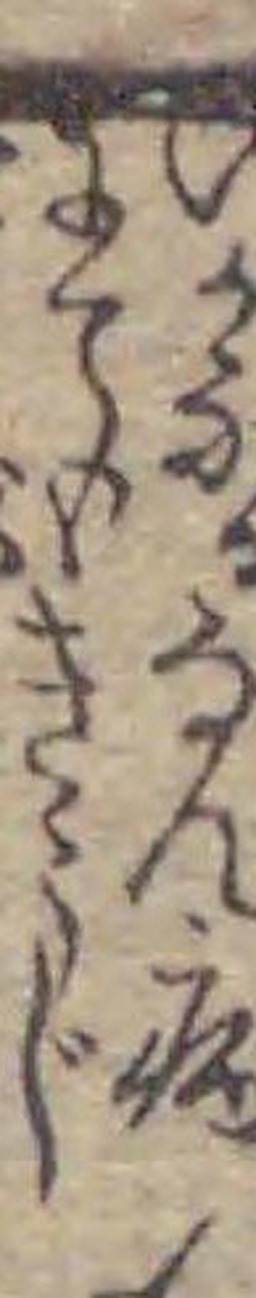にてもきうじ
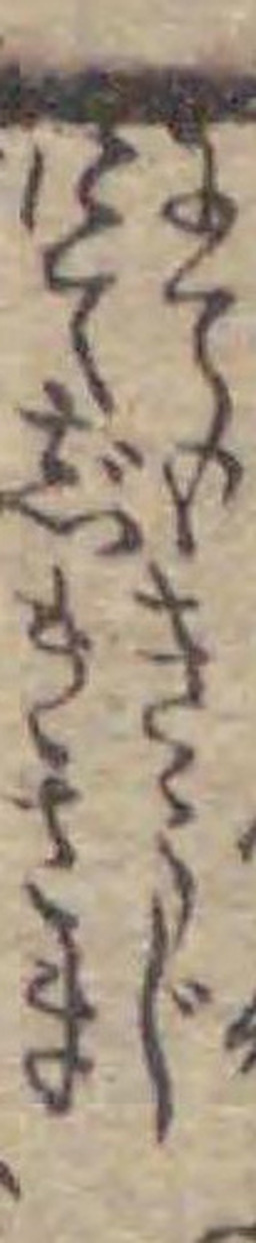にてじきさま
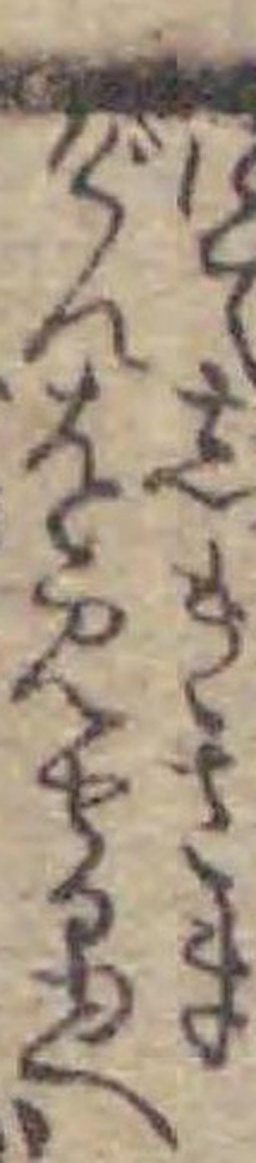げんを見せるゆへ
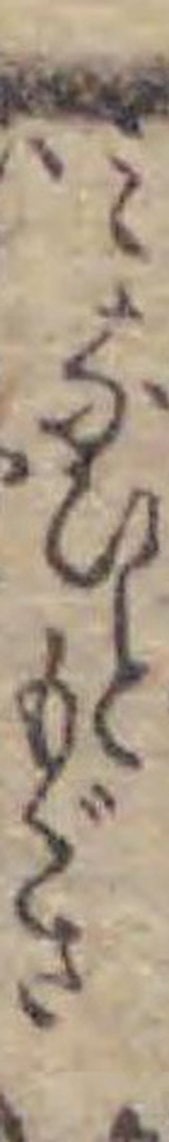みなひともぐさ
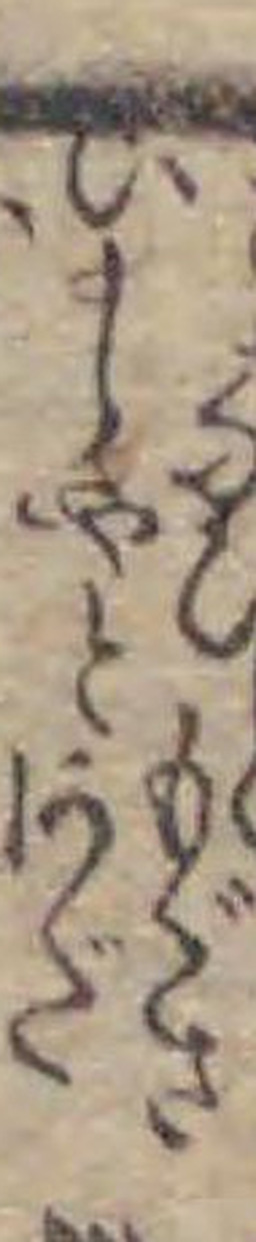いしやとあだ
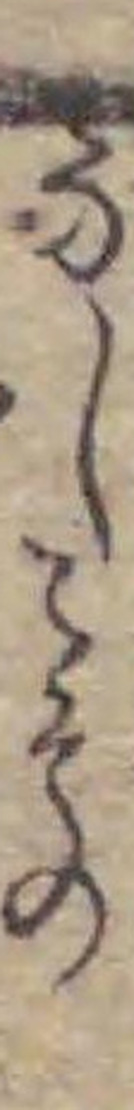なしてその
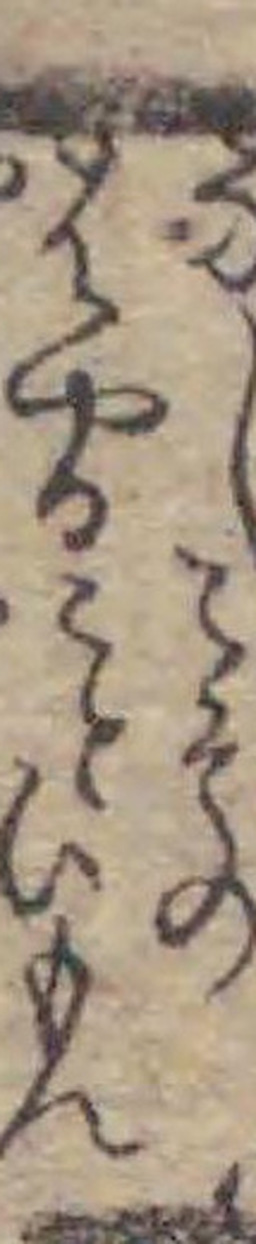はやることひもん
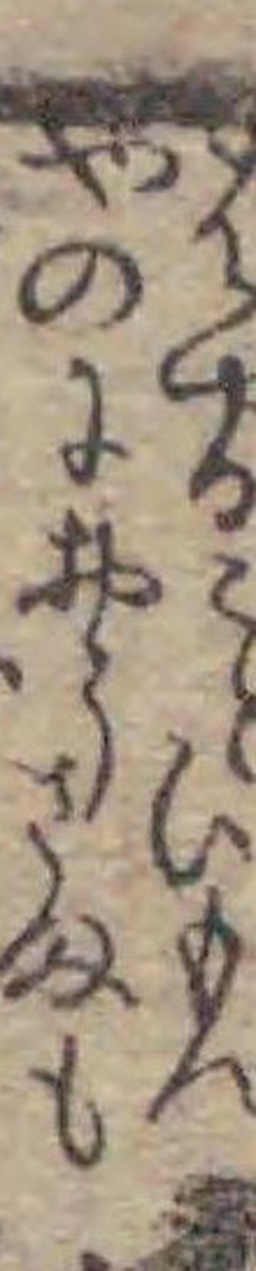やのにおう様も
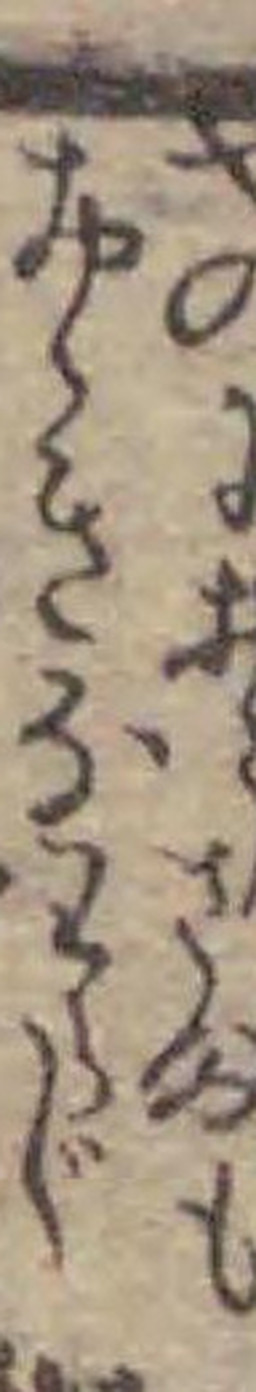おゝきなわらじ
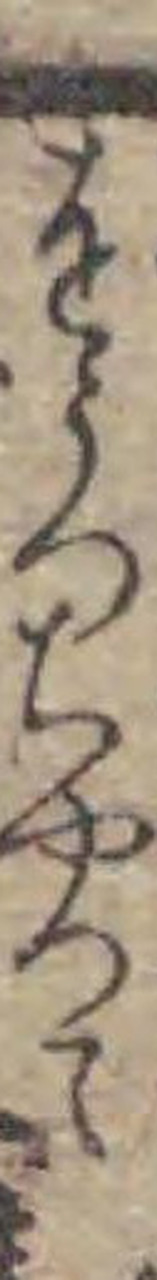をうつちやつて
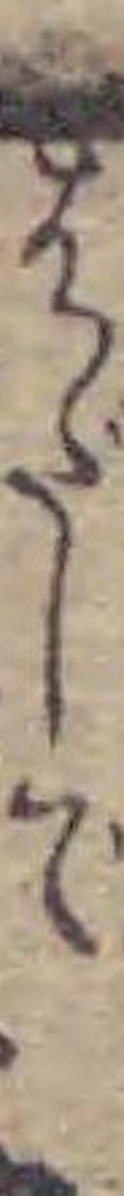はだしで
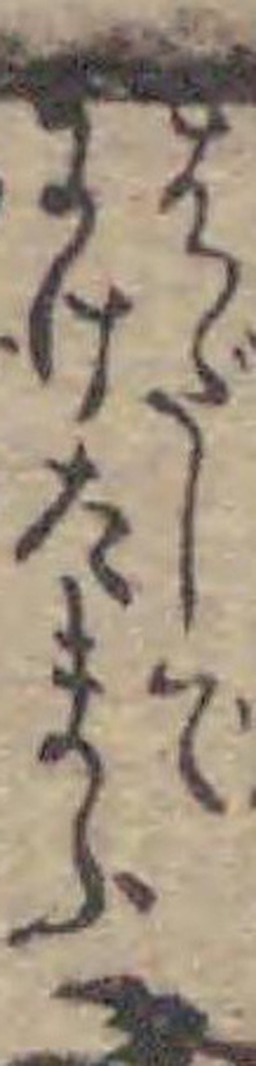にげたまふ
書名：江戸花俳優贔屓 : 3巻
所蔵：国立国会図書館 National Diet Library, JAPAN
